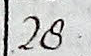28
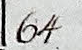64
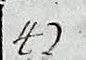42
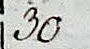30
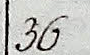36
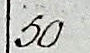50
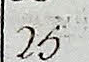25
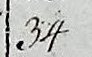34
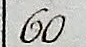60
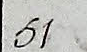51
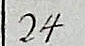24
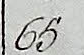65
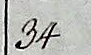34
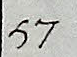57
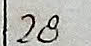28
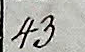43
